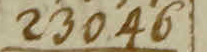23046
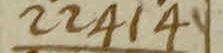22414
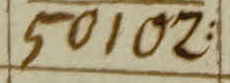50102
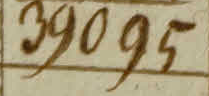39095
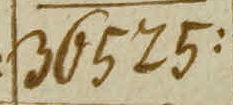36525
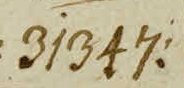31347
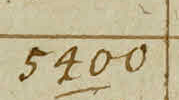5400
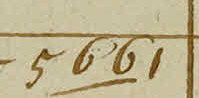5661
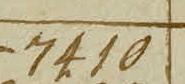7410
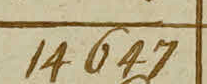14647
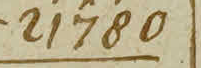21780
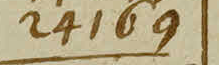24169
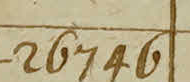26746
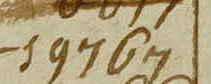19767
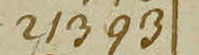21393
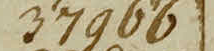37966
